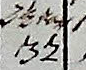32
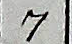7
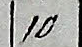10
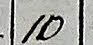10
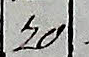20
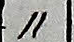11
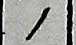1
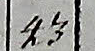43
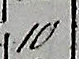10
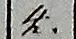4
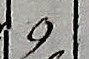9
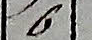6
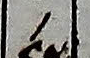1
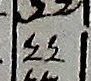22
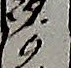9
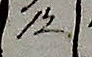12
